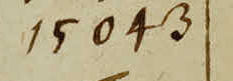15043
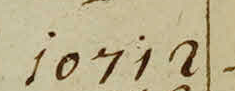10712
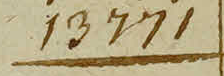13771
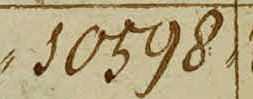10598:
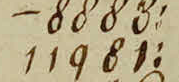11981
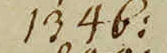1346
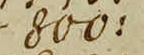800
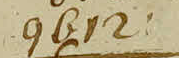9612
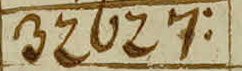32627:
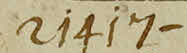21417
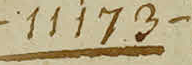11173
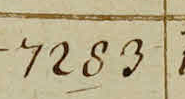7283
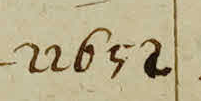22652
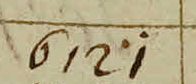6121
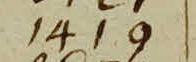1419
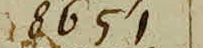8651
